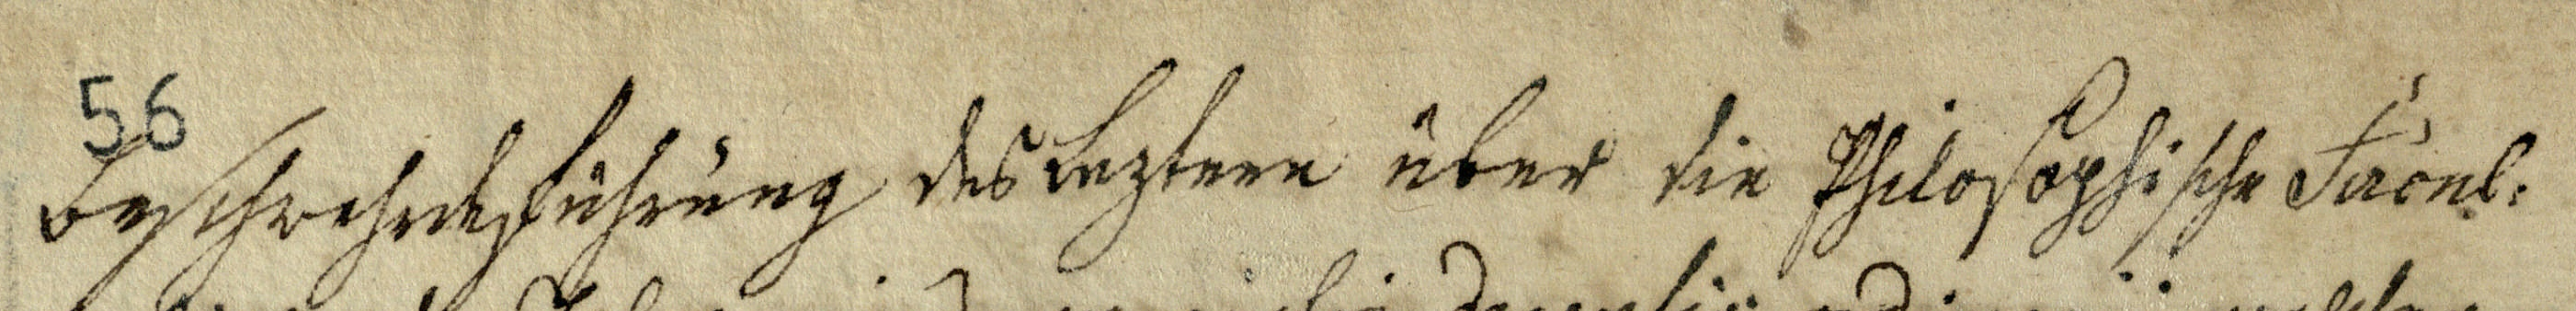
Beschwehrdeführung des Leztern über die Philosophische Facul¬
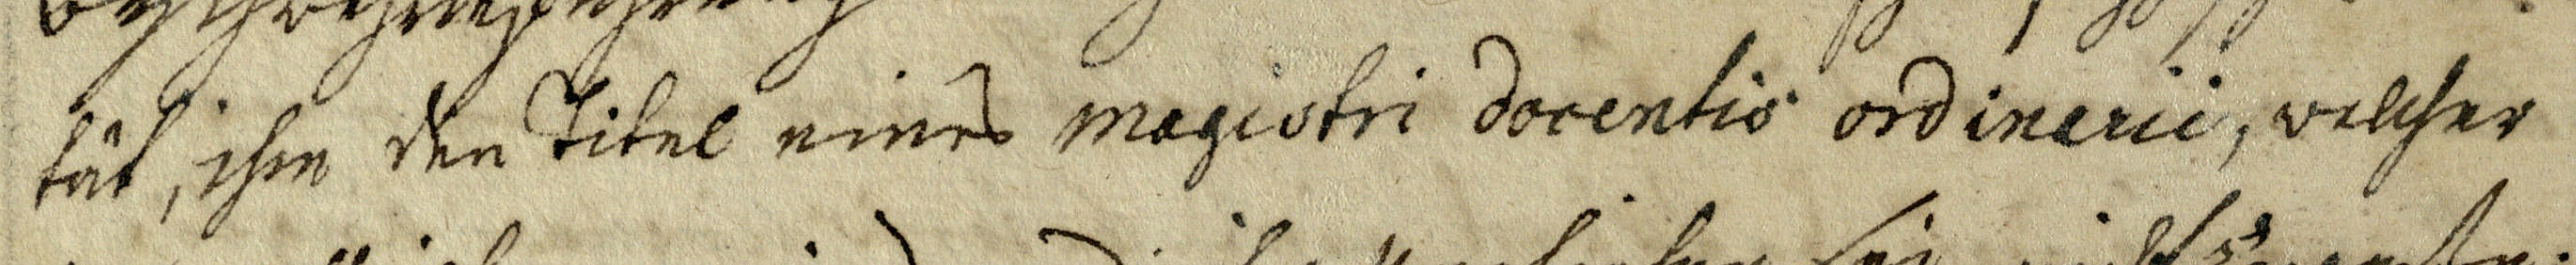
tät ihm der Titel eines magistri docentis ondinarie, welcher
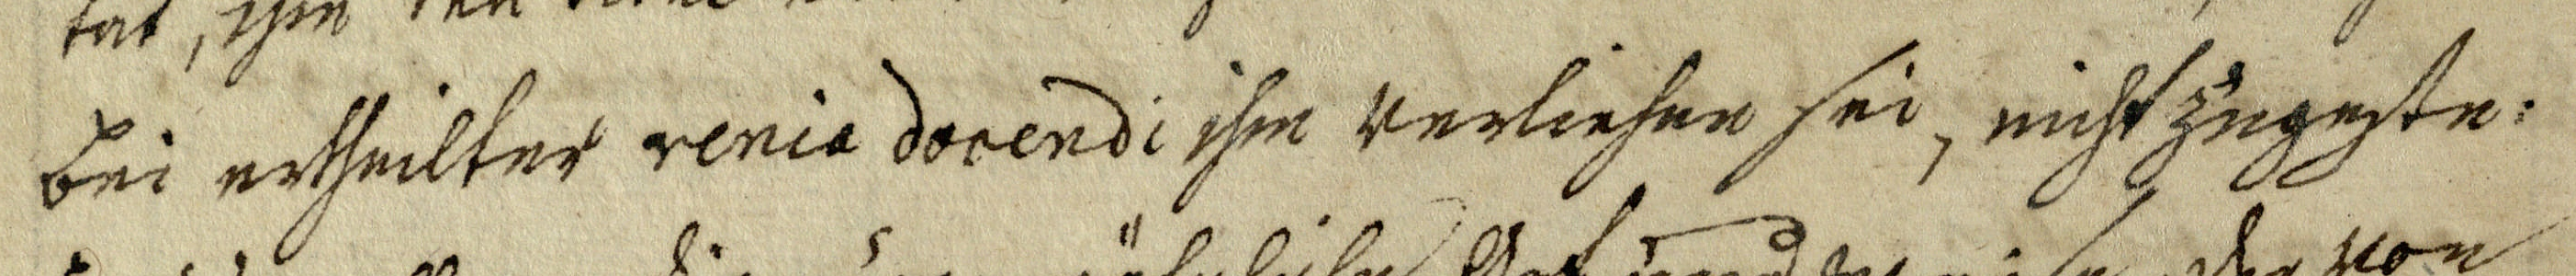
bei ertheilter venia docendi ihm verliehen sei, nicht zugeste¬
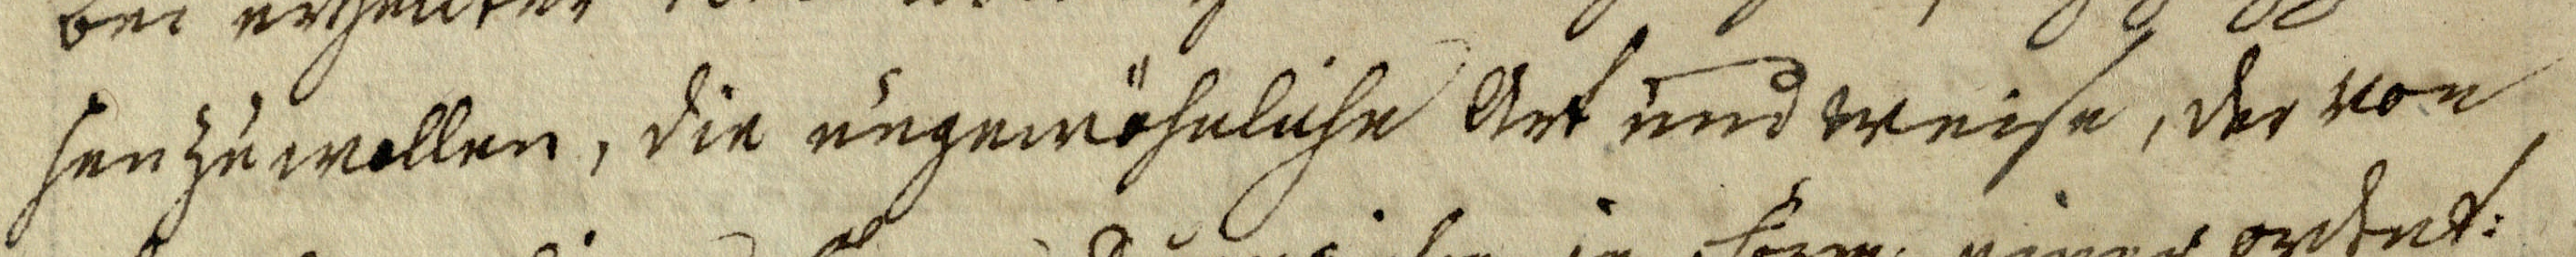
hen zu wollen, die ungewöhnliche Art und weise, der von
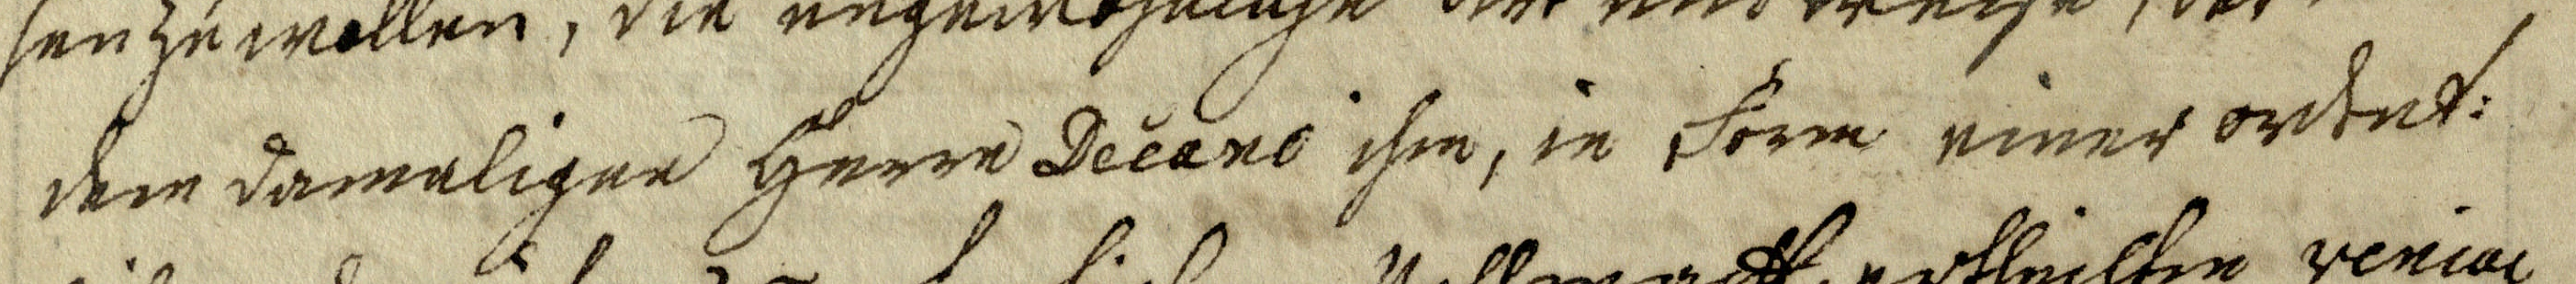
dem damaligen Herrn Decano ihm, in Form einer ordent¬
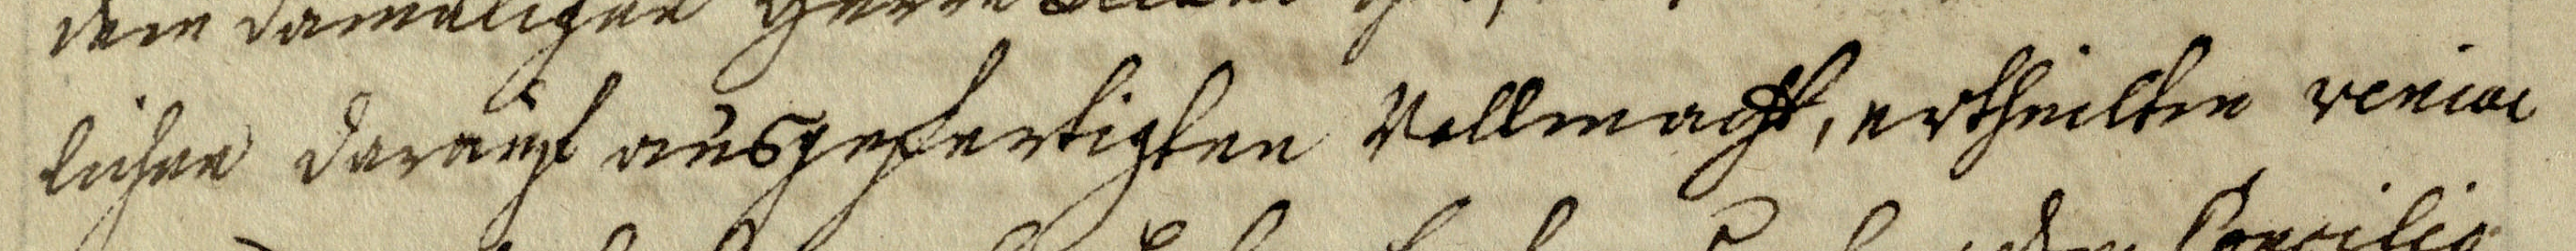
lichen darauf ausgefertigten Vollmacht, ertheilten veniae
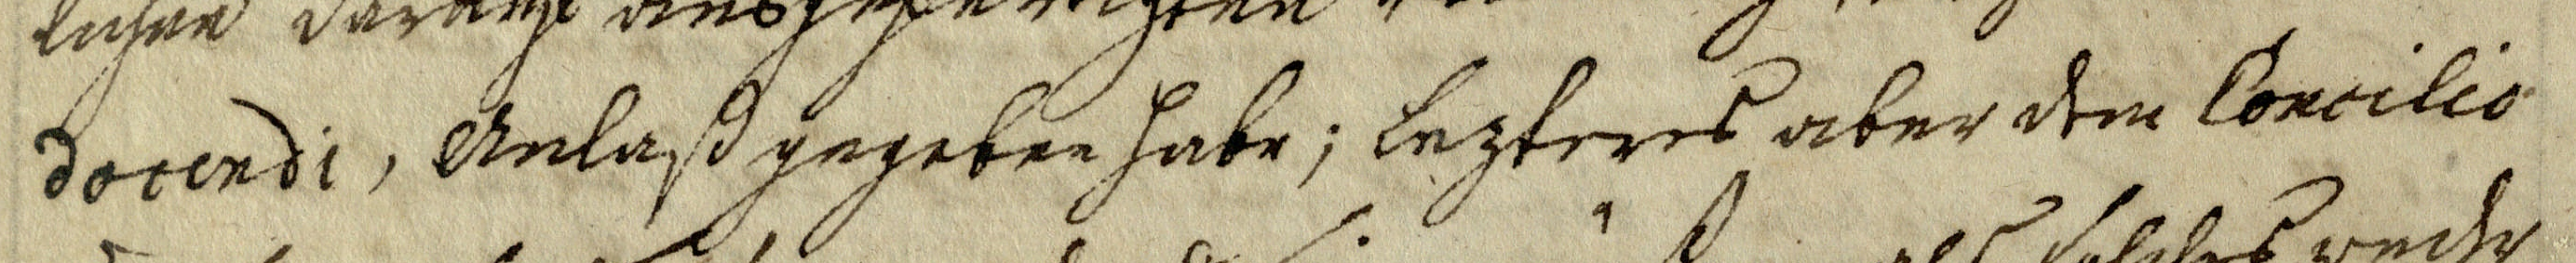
docendi, Anlaß gegeben habe, lezteres aber dem Concilio
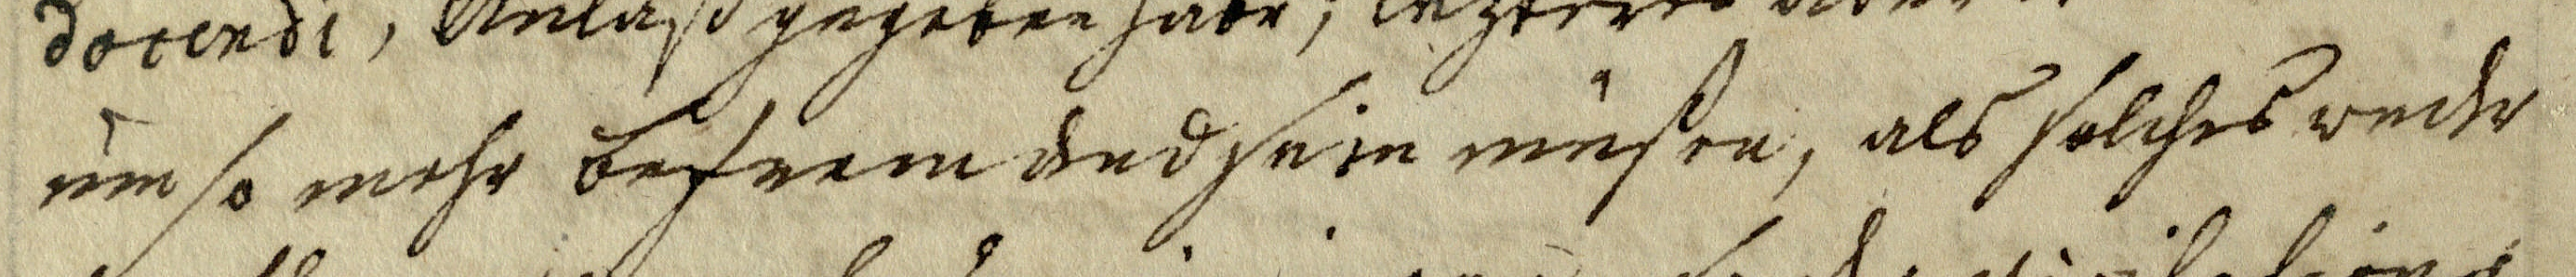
um so mehr befremdend sein müßen, als solches weder
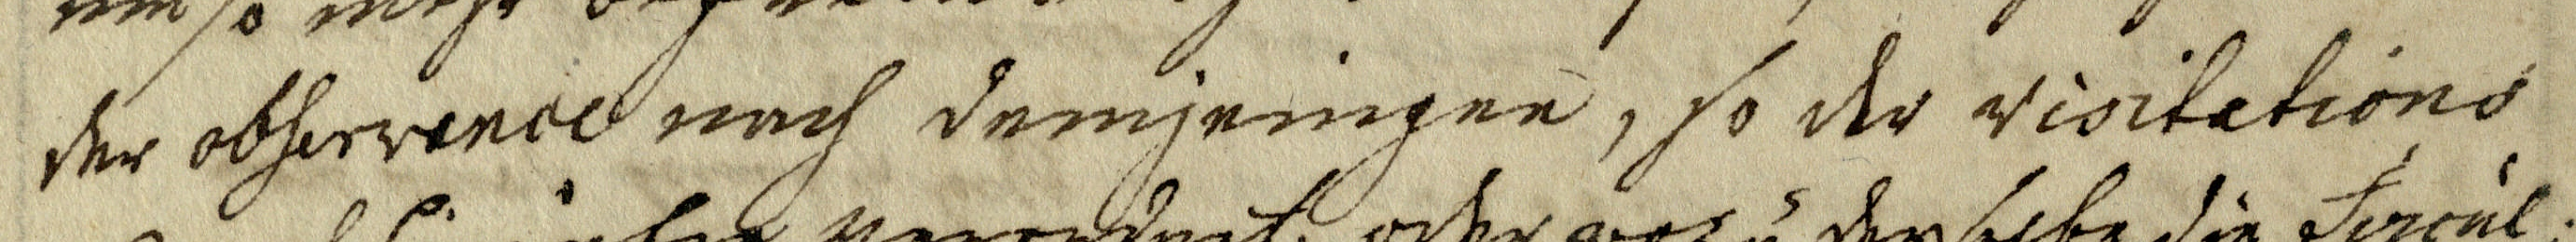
der observance nach demjenigen, so der Visitations
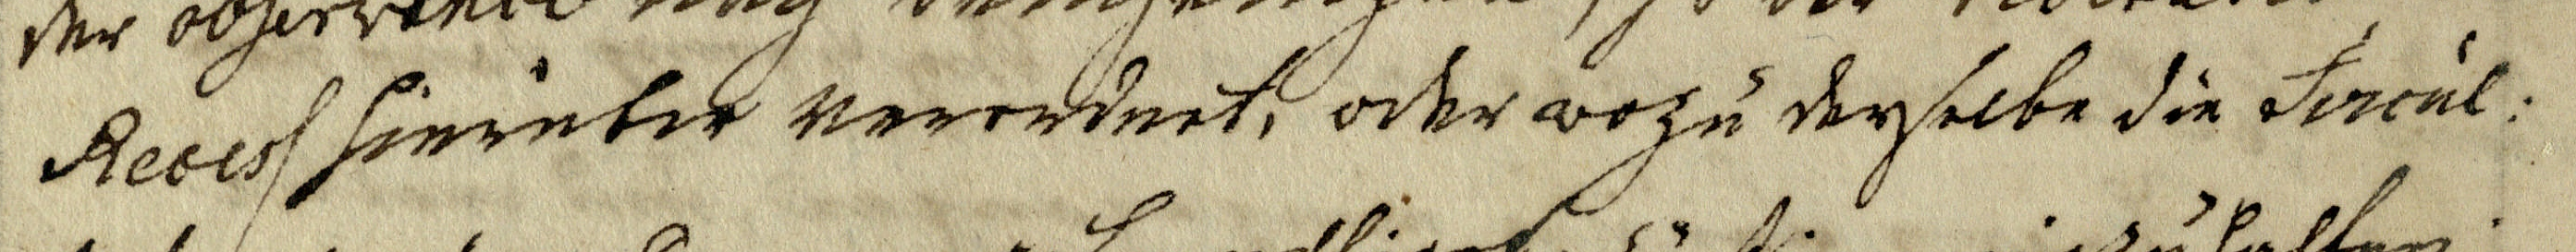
Recess hierüber verordnet, oder wozu derselbe die Facul¬
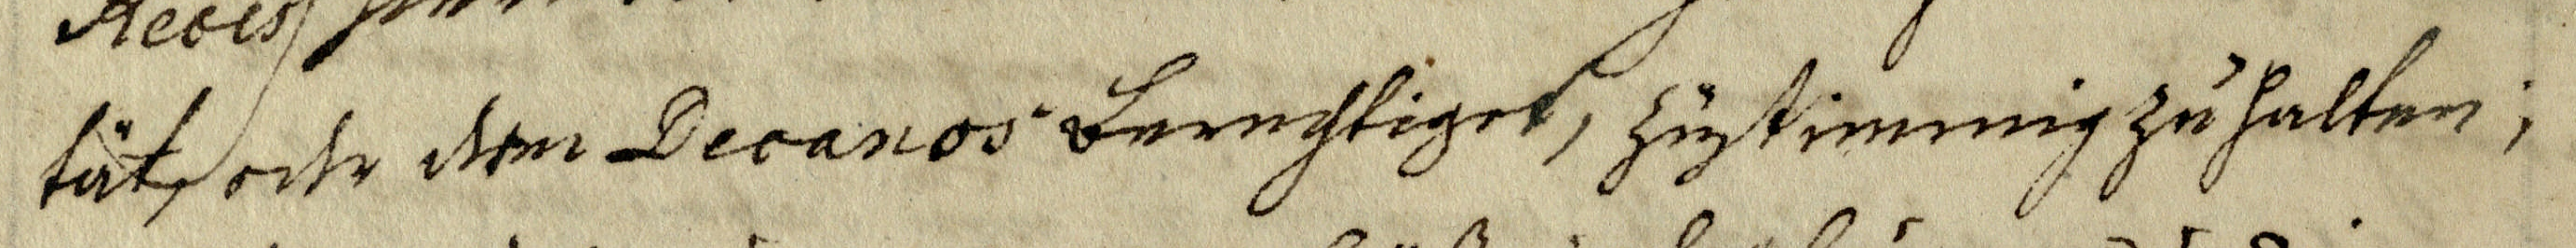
tät oder dem Decanos berechtiget, zustimmig zu halten;
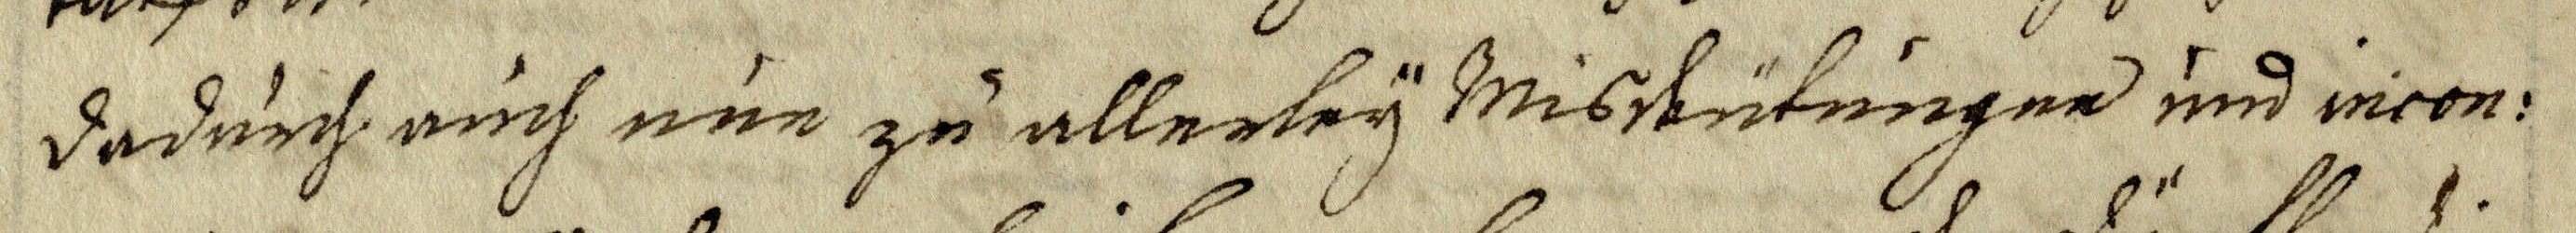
dadurch auch nun zu allerleÿ Misdeutungen und incon¬
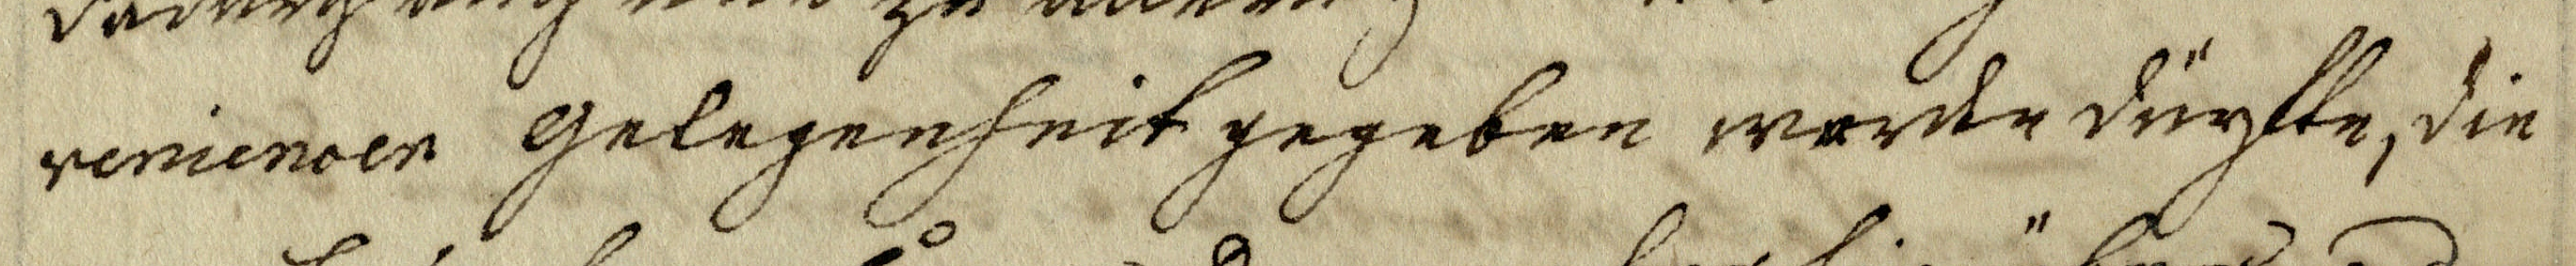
veniencen Gelegenheit gegeben werden dürfte, die
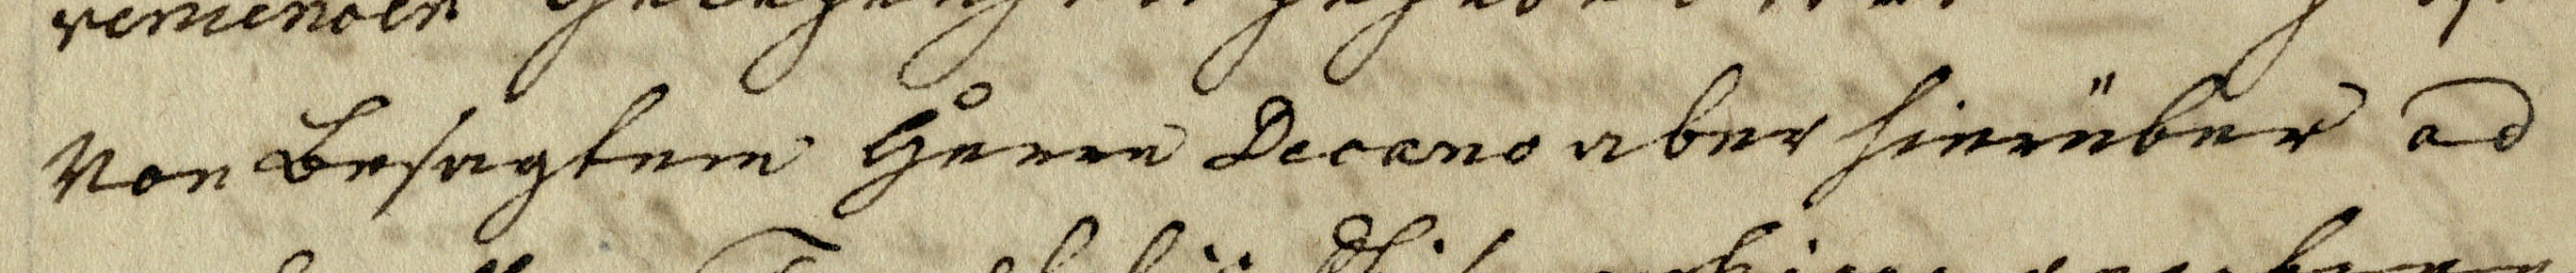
von besagtem Herrn Decano aber hierüber ad
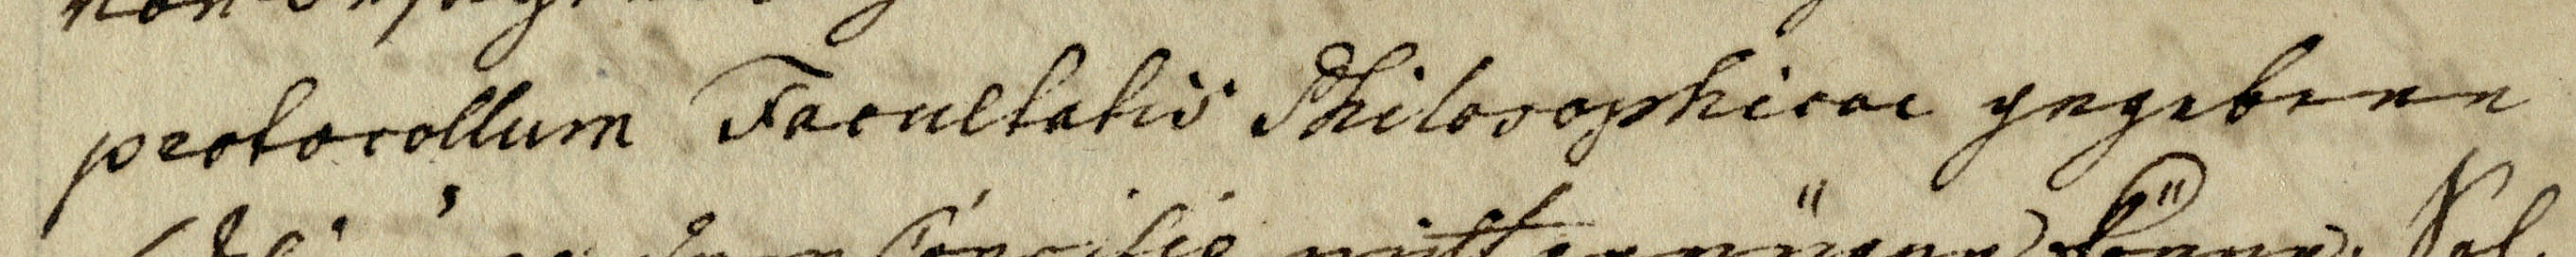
protocollum Facultatis Philosophicae gegebene
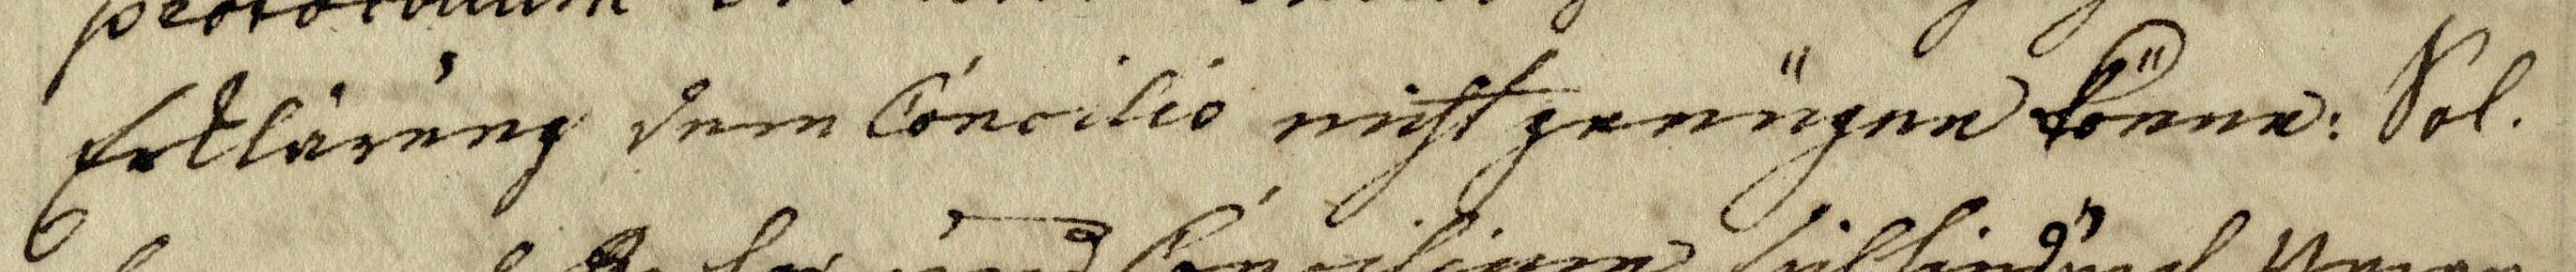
Erklärung dem Concilio nicht genügen könne. Sol¬
